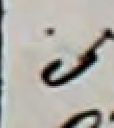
5
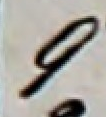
9
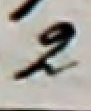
2
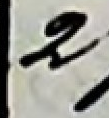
2
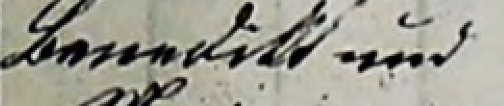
Benedikt und
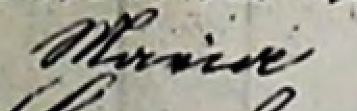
Maria
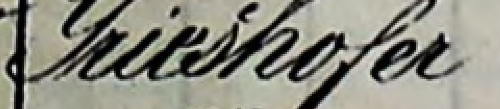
Grieshofer
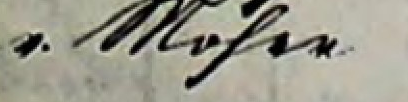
v. Moser
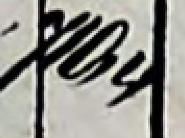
710,4
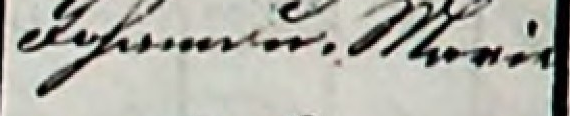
Johann u. Marie
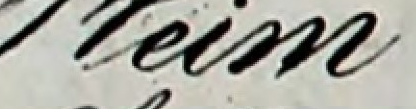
Heim
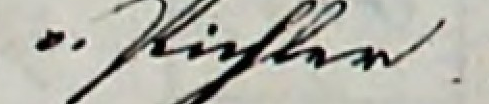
v. Pichler
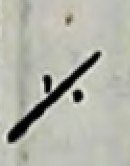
./.
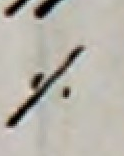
./.
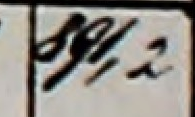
891,2
